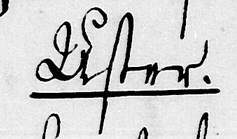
Uster.
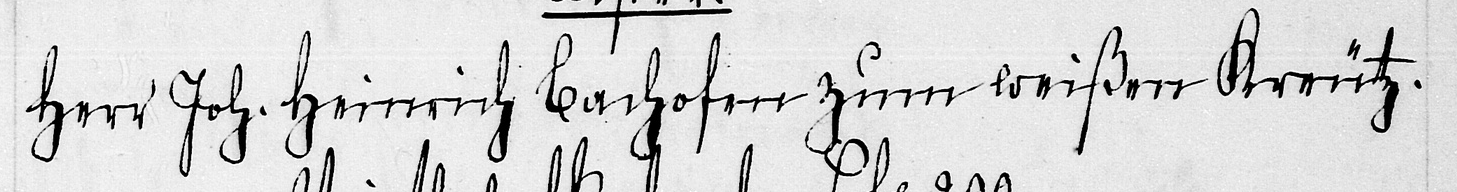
Herr Joh. Heinrich Bachofen zum weißen Kreutz.
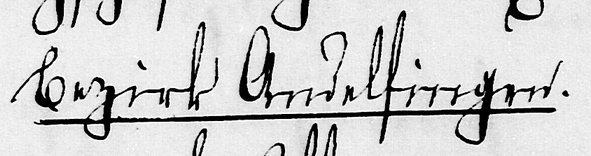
Bezirk Andelfingen.
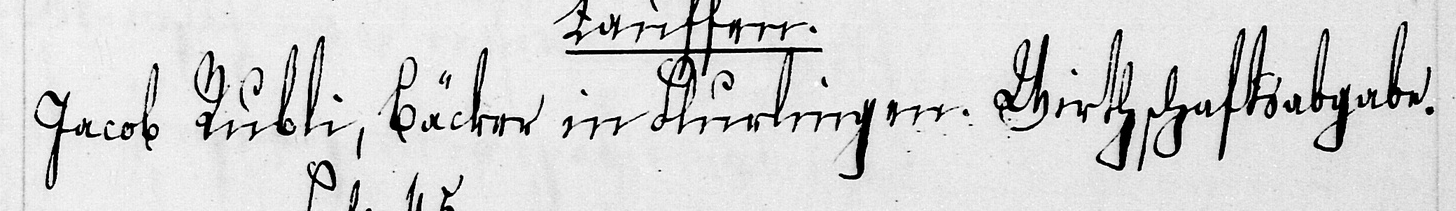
Jacob Rubli, Bäcker in Flurlingen. Wirthschaftsabgabe
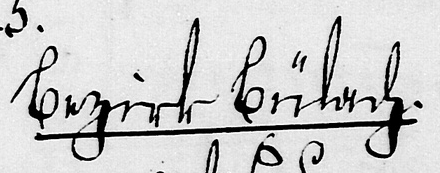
Bezirk Bülach.
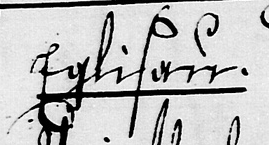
Eglisau.
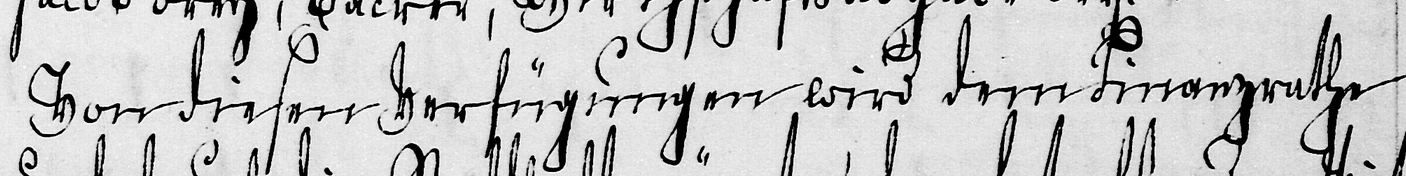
Von diesem Verfügungen wird dem Finanzrathe
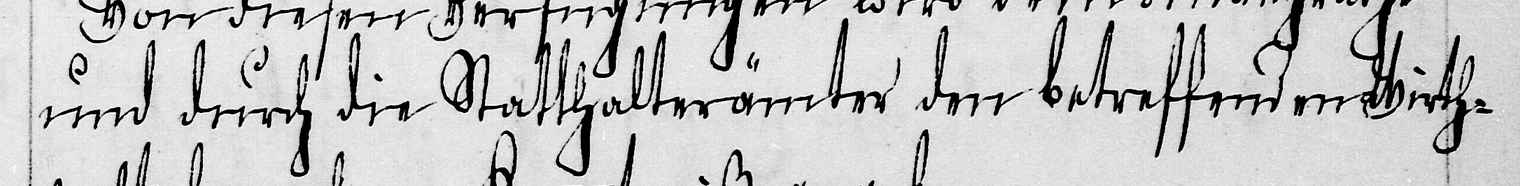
und durch die Statthalterämter den betreffenden Wirth¬
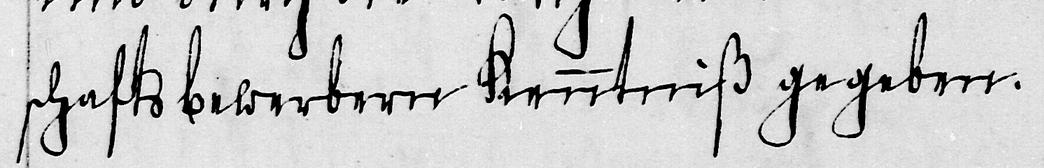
schaftsbewerbern Kenntniß gegeben.
